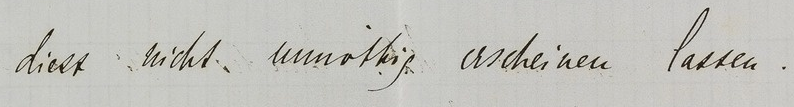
diess nicht unnöthig erscheinen lassen.
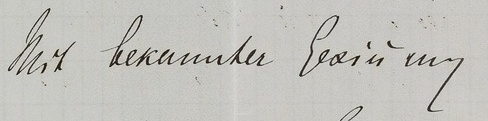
Mit bekannter Gesinnung
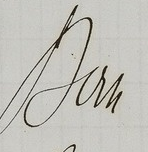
Bern
